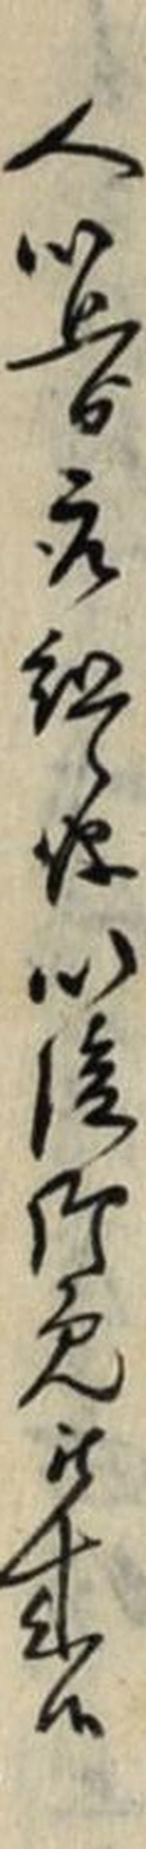人以上ゟ取組之儀以後御免被成候
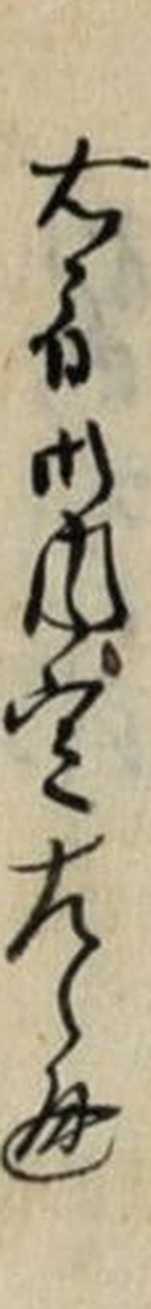右ニ付御内定左之通
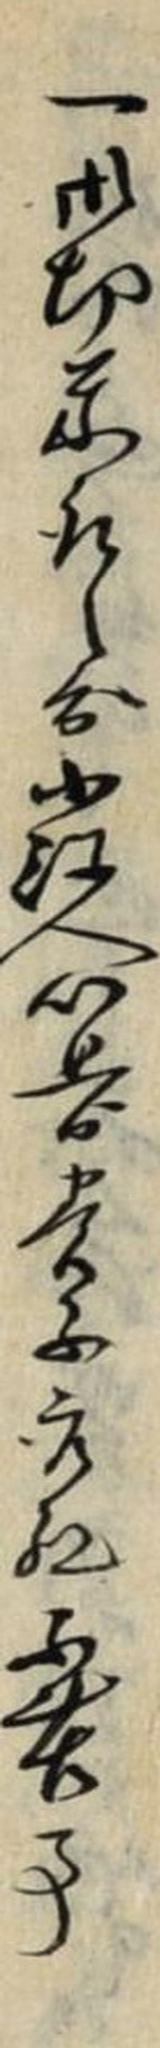一御切米取之分小役人以上ゟ養子取組不苦事
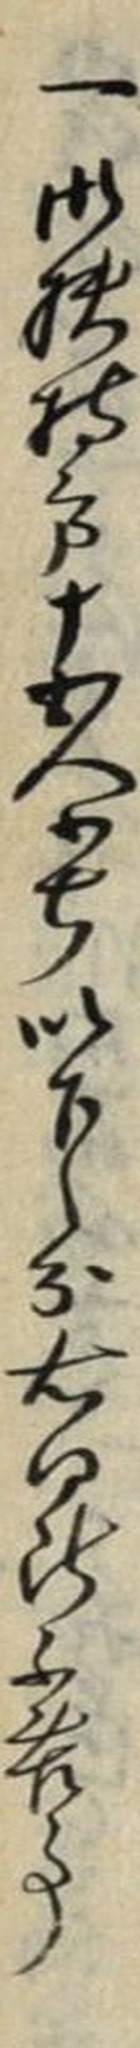一御扶持方十五人ふち以下之分右同断不苦事
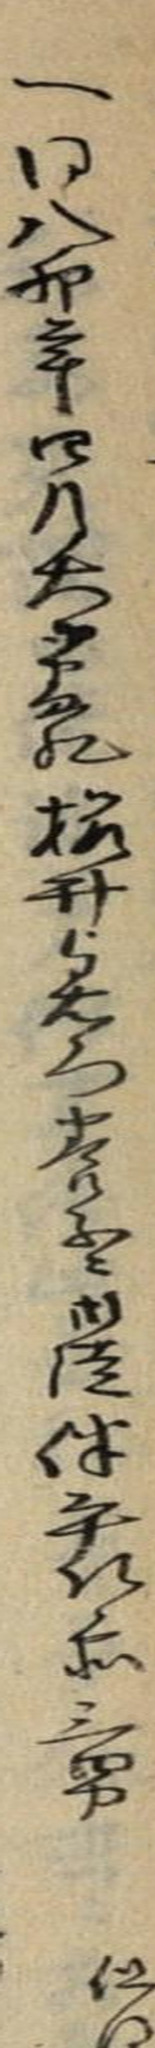一同八卯年四月大御番組桜井与右衛門養子ニ御徒伴平次兵衛三男但同断
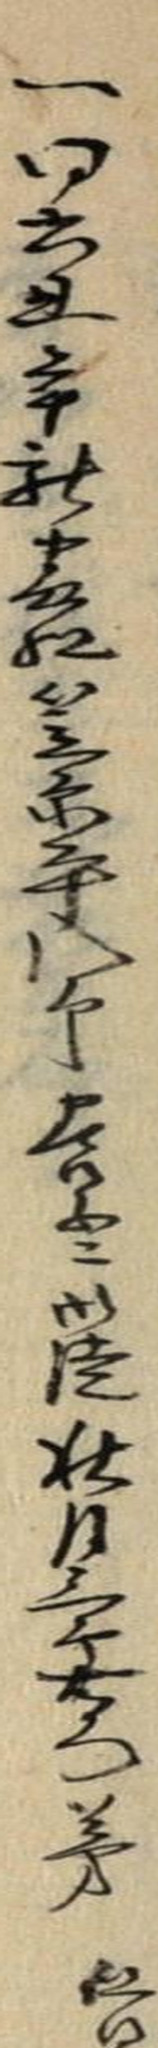一同六丑年新番組笠原平八郎養子ニ御徒秋月三郎右衛門弟但同断
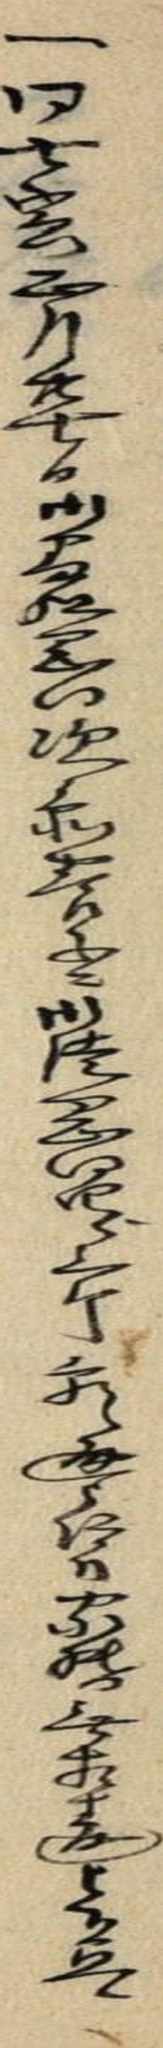一同七寅正月廿七日御番組岡田次兵衛養子ニ御徒岡田四郎三郎願之通被仰付家督無相違被下置候
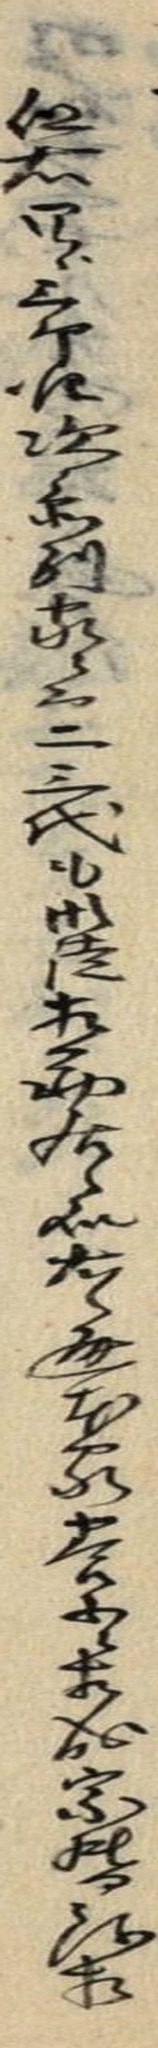但右四郎三郎儀次兵衛別家ニ而二三代も御徒相勤居候処右之通本家養子ニ相成家督致相
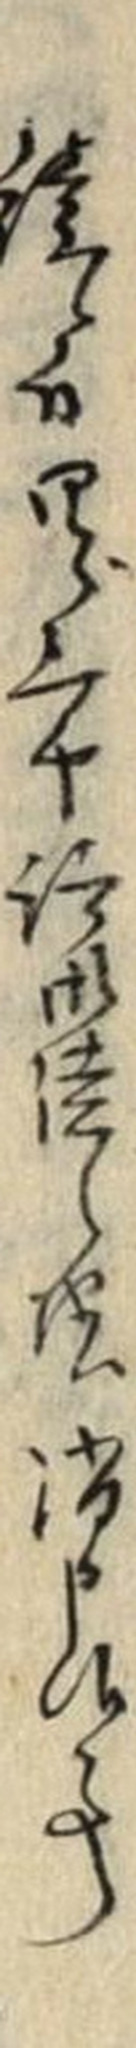続候ニ而四郎三郎跡御徒之儀ハ消申候事
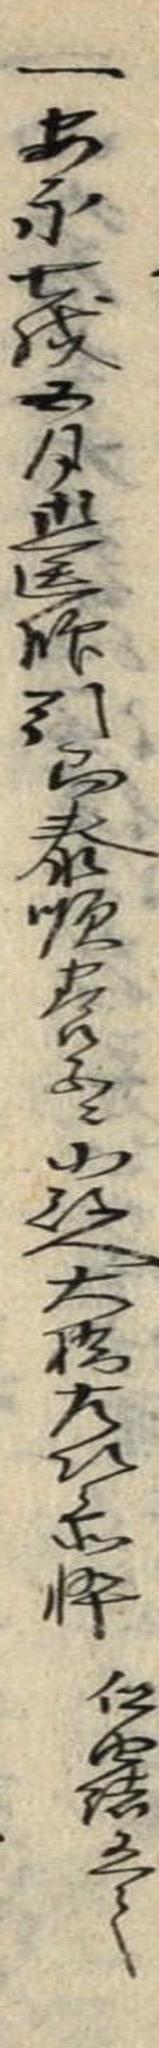一安永七戌五月御医師引間泰順養子ニ小役人大橋左治兵衛倅但由緒有之
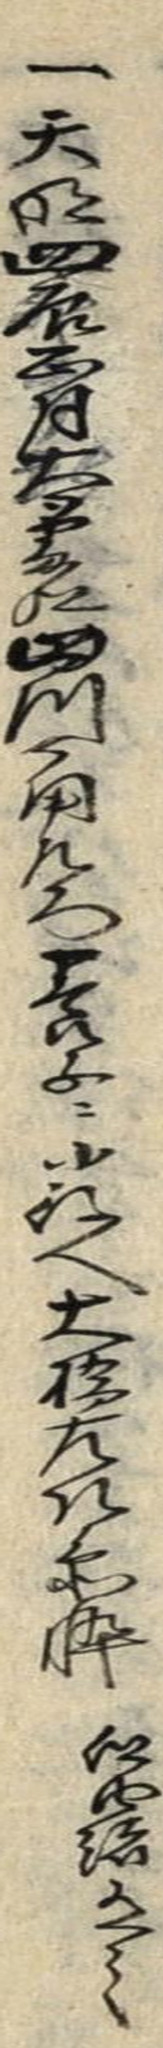一天明四辰正月大御番組田川角左衛門養子ニ小役人大橋左次兵衛倅但由緒有之
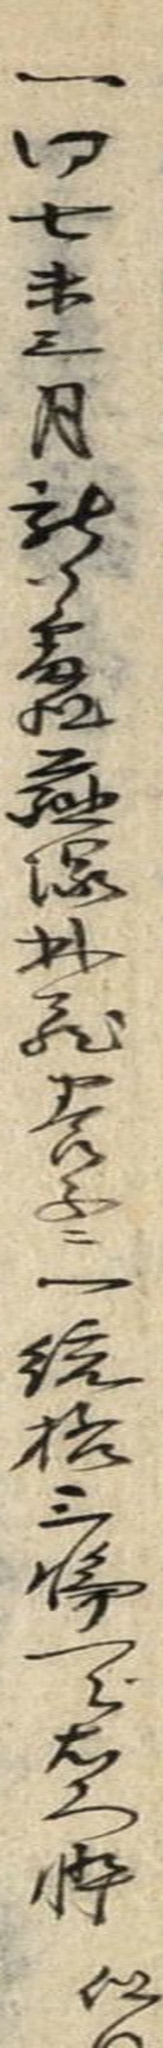一同七未三月新御番組韮塚林蔵養子ニ一統格三輪一郎右衛門倅但同断
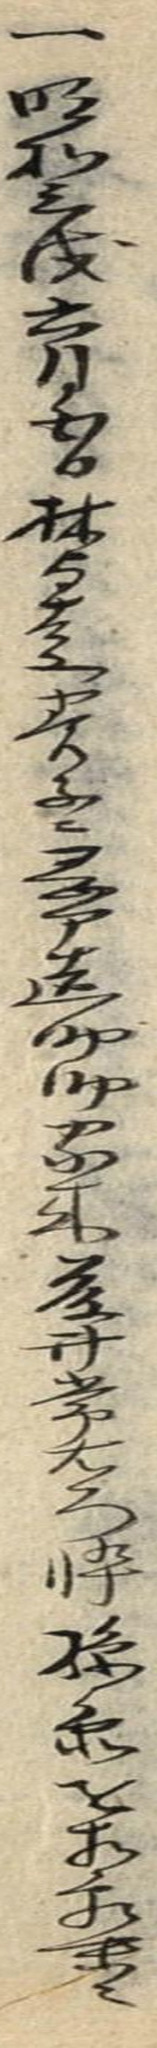一明和三戌六月五日林与太夫養子ニ岡部遠助助家来藤井常右衛門倅孫兵衛を相願末々
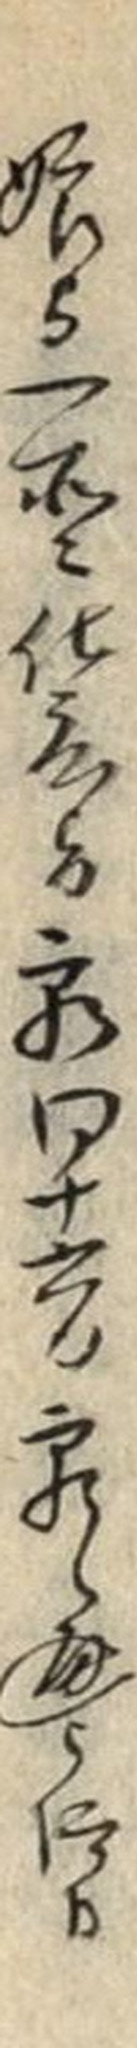娘与一所ニ仕度旨願同十六日願之通被仰付
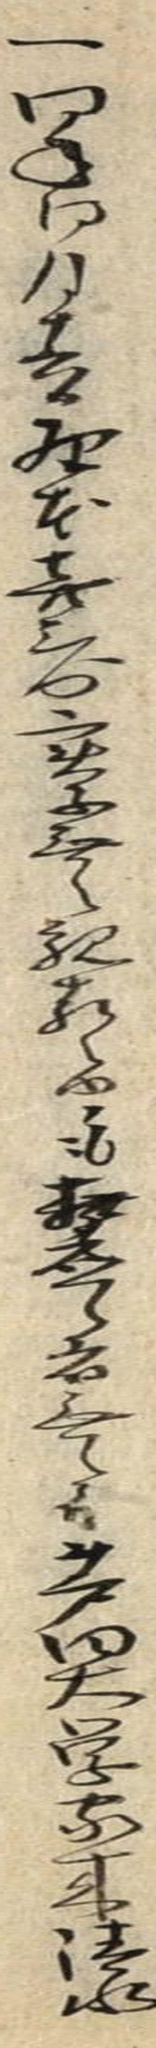一同年四月十六日野本喜三右衛門実子無之親類之内ニも相応候者無之ニ付芦田大学家来清水
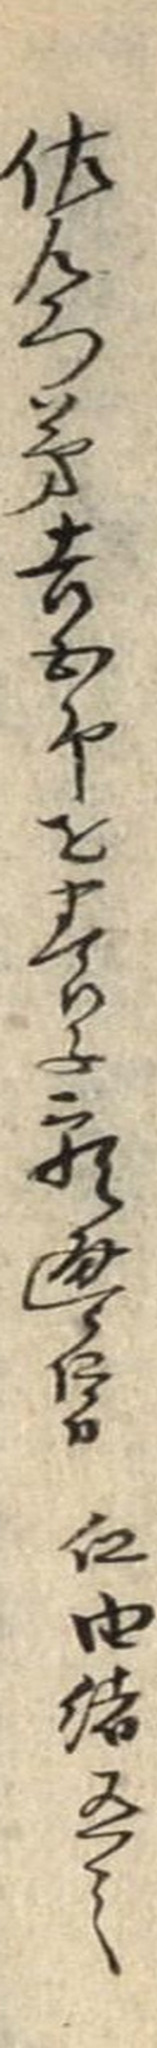佐左衛門弟吉五郎を養子願候通被仰付但由緒有之
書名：養子縁組之部
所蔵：福井県文書館 Fukui Prefectural Archives
